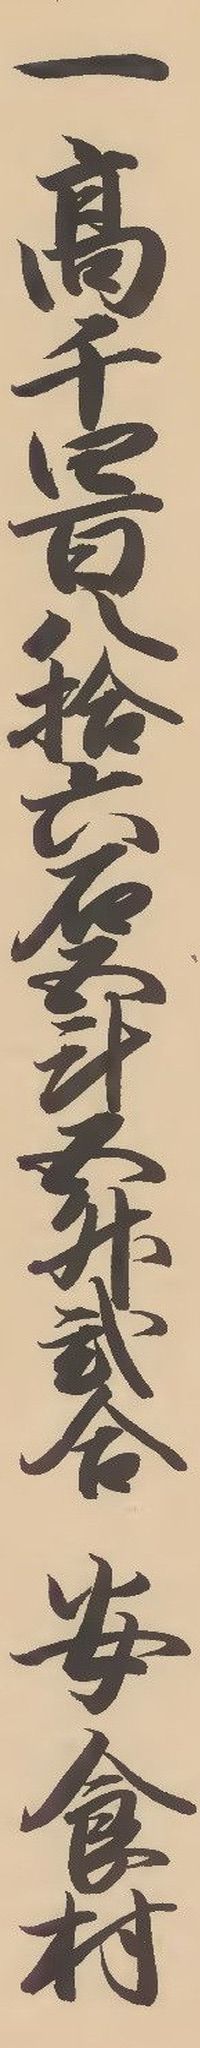一高千四百八拾六石五斗五升弐合安食村

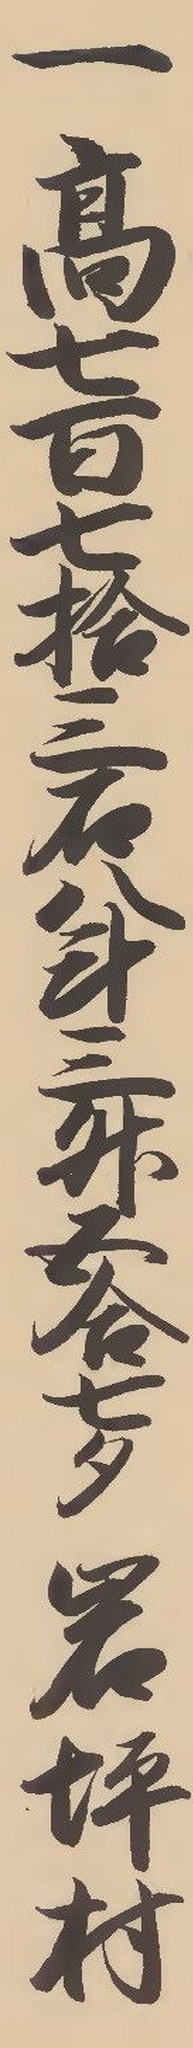一高七百七拾三石八斗三升五合七勺岩坪村
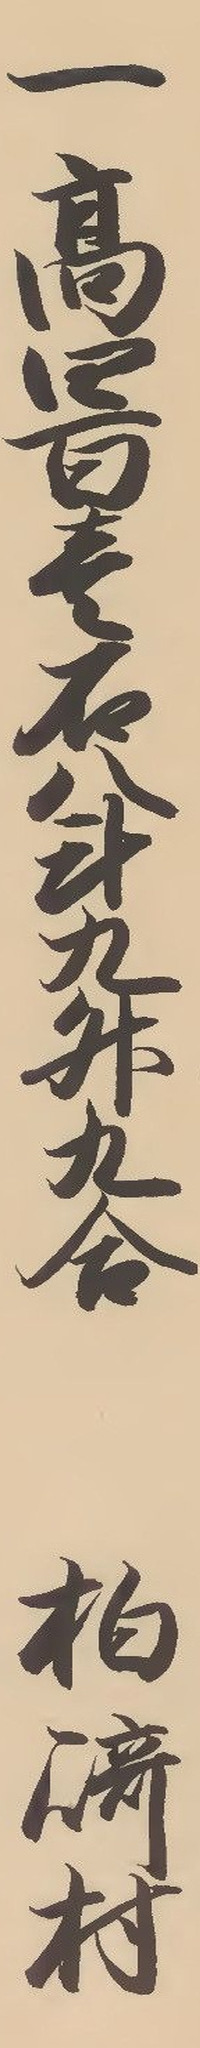一高四百壱石八斗九升九合柏崎村
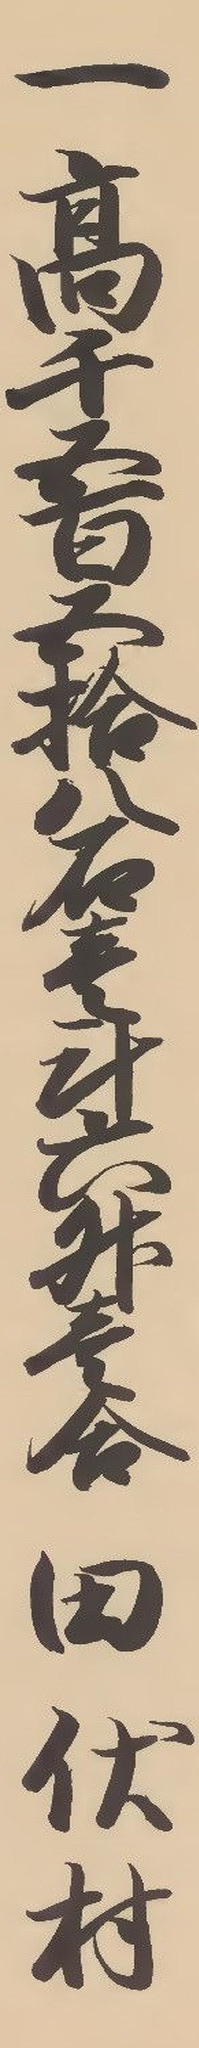一高千五百五拾八石壱斗六升壱合田伏村
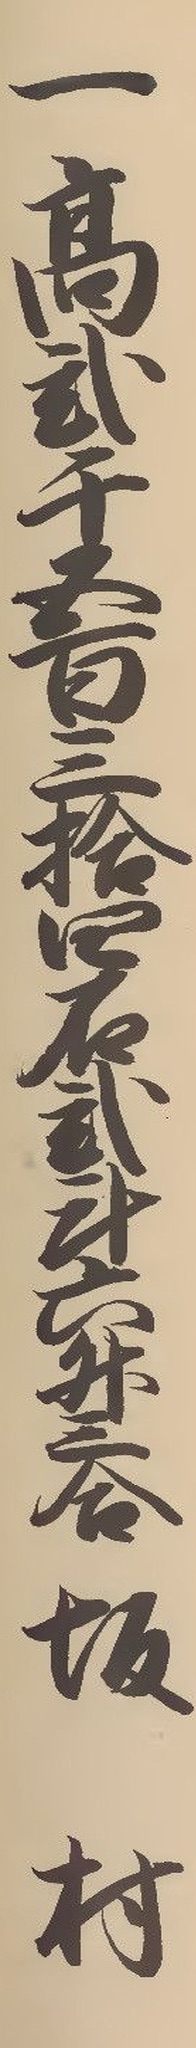一高弐千五百三拾四石弐斗六升三合坂村
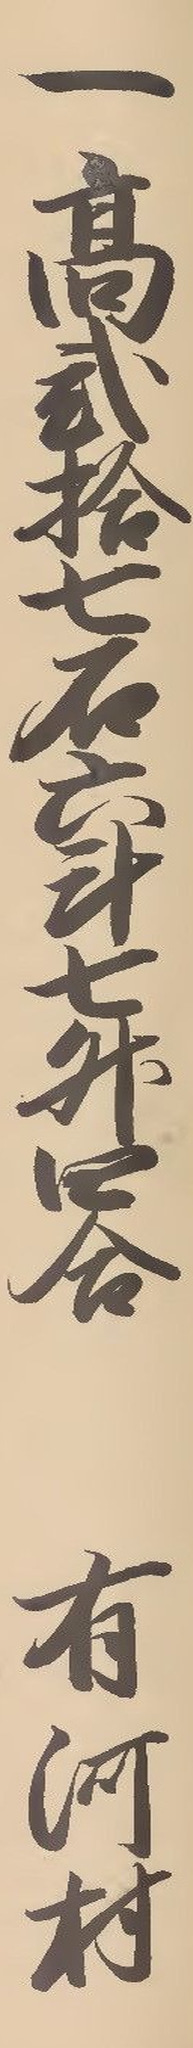一高弐拾七石六斗七升四合有河村
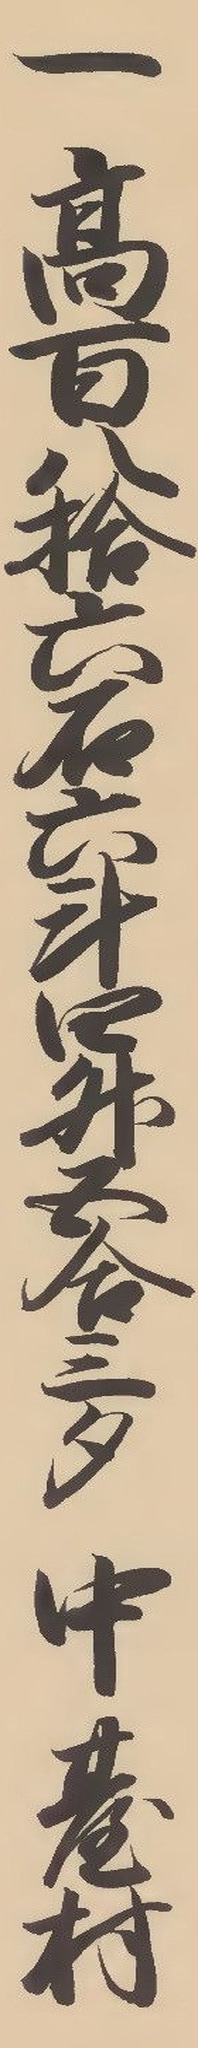一高百八拾六石六斗四升五合三勺中台村
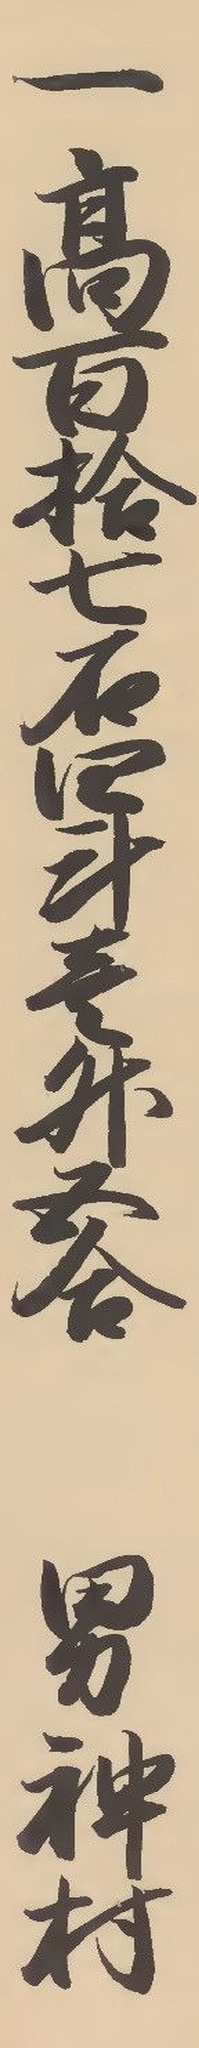一高百拾七石四斗壱升五合男神村
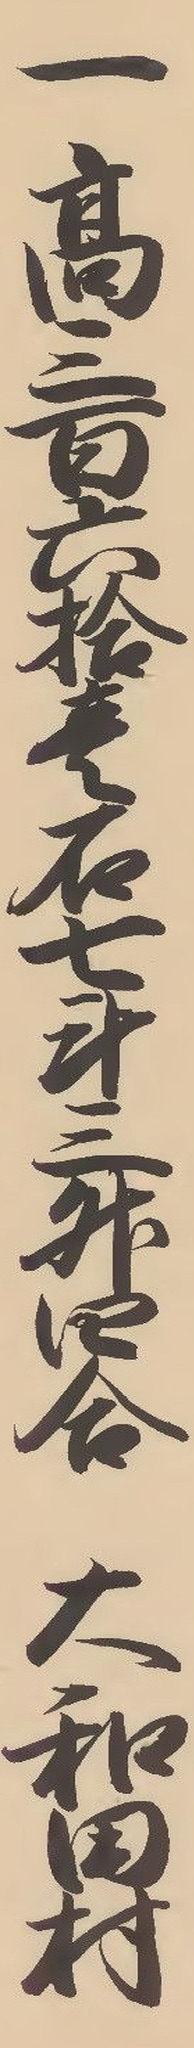一高三百六拾壱石七斗三升四合大和田村

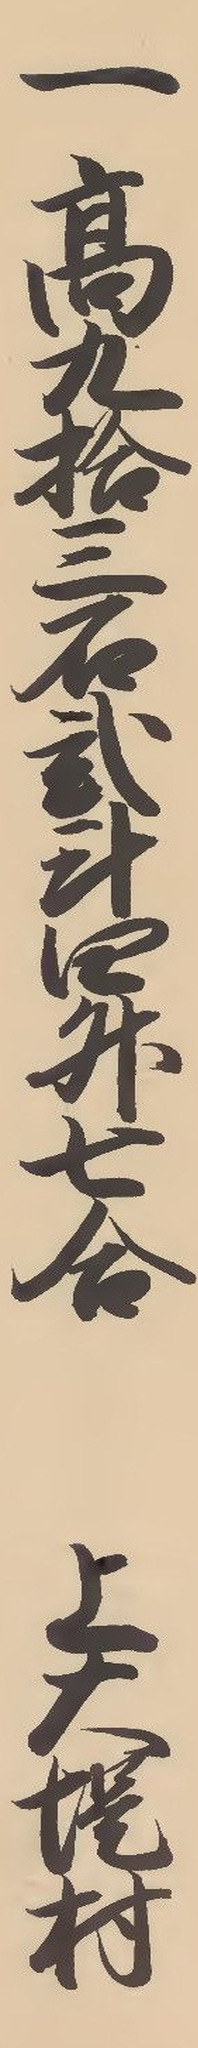一高九拾三石弐斗四升七合上大堤村
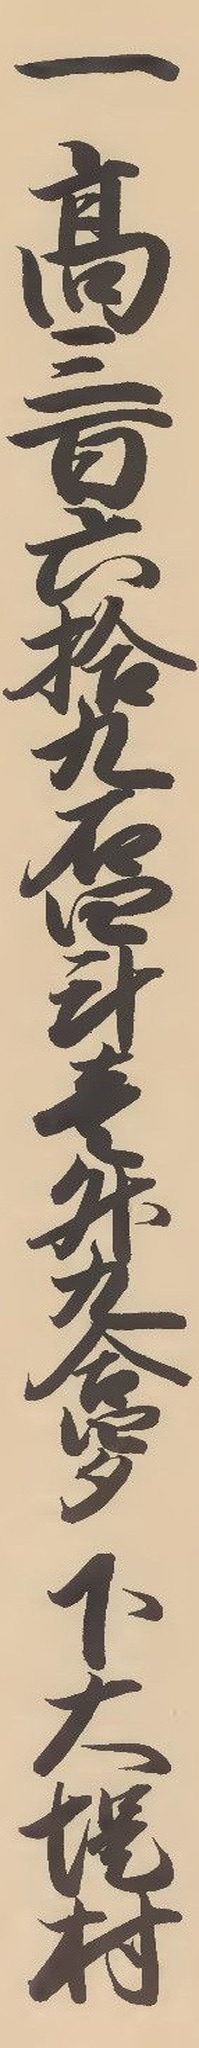一高三百六拾九石四斗壱升九合四勺下大堤村
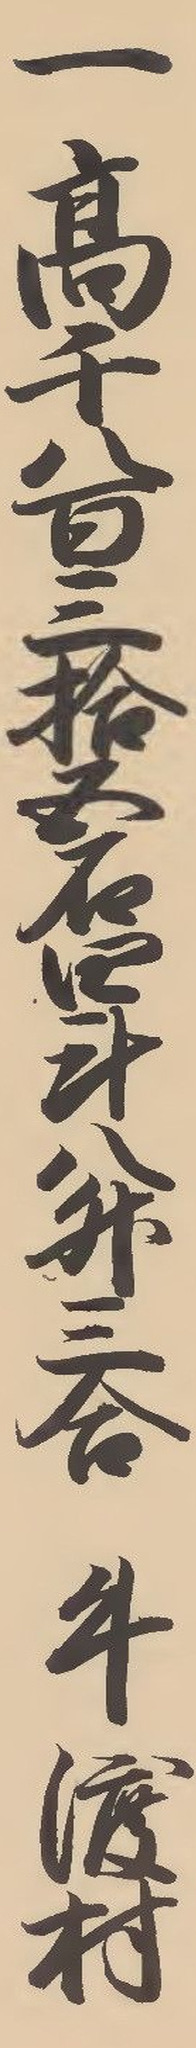一高千八百三拾五石四斗八升三合牛渡村
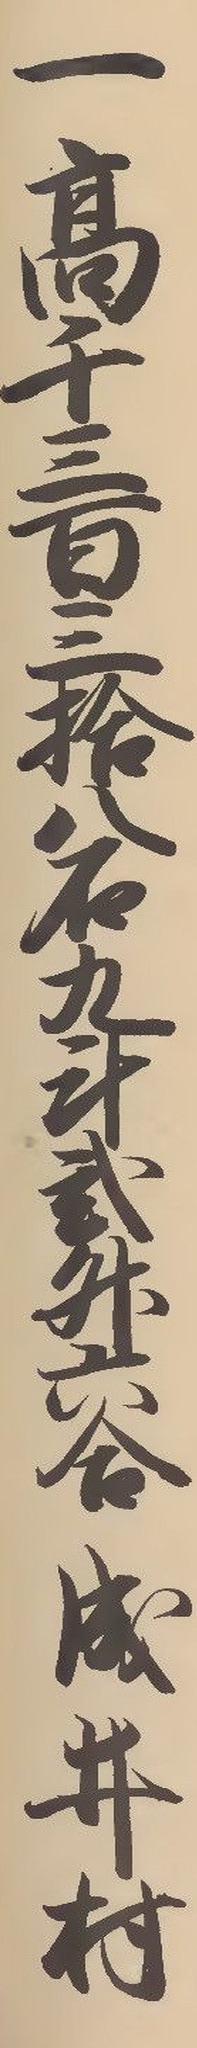一高千三百三拾八石九斗弐升六合成井村
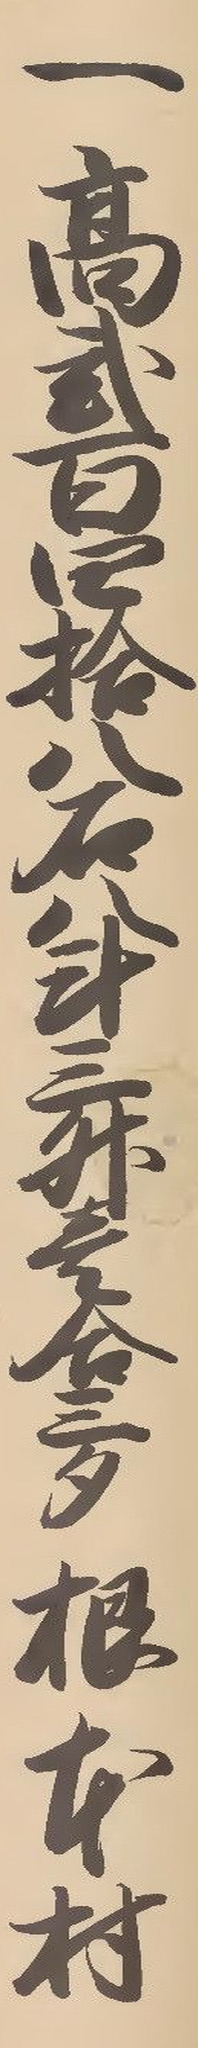一高弐百四拾八石八斗三升壱合三勺根本村
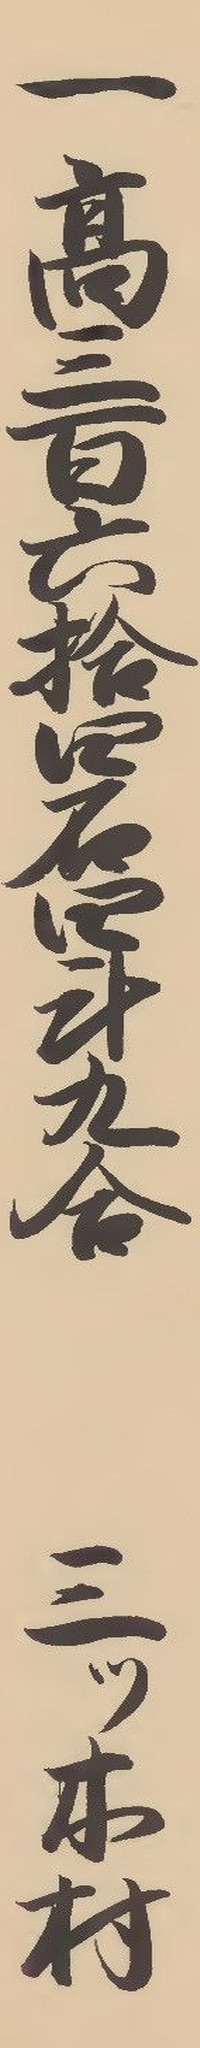一高三百六拾四石四斗九合三ッ木村
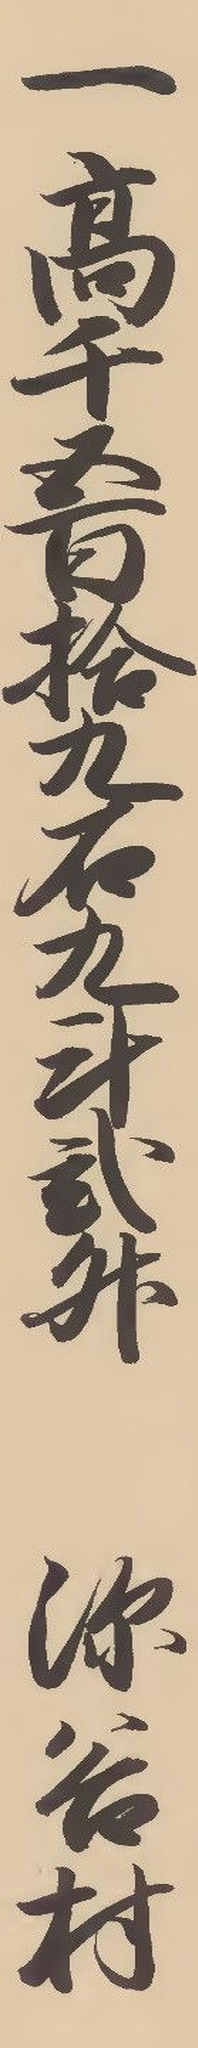一高千五百拾九石九斗弐升深谷村
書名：常陸国郷帳
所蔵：国立公文書館 National Archives of Japan
